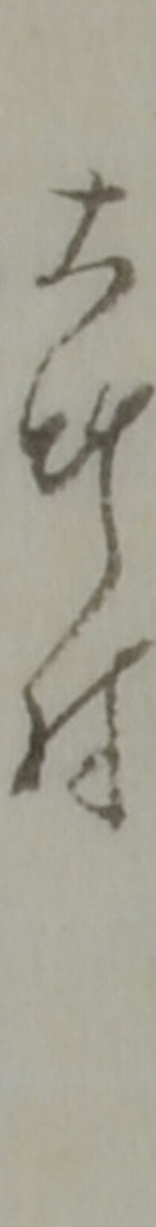大艸村
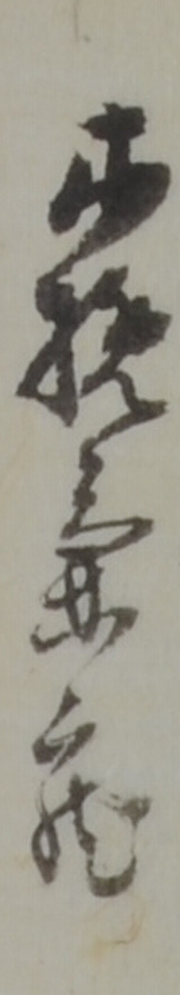木挽兼蔵
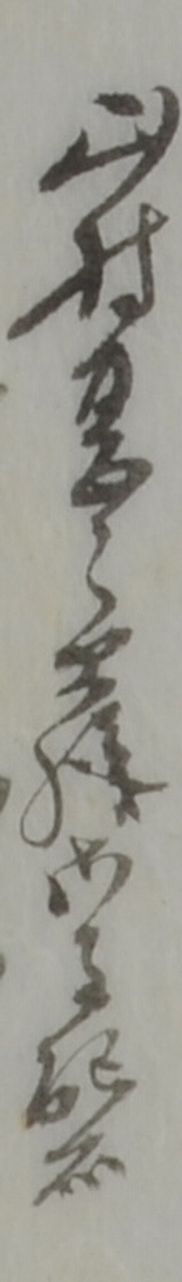山村甚之丞様御支配所
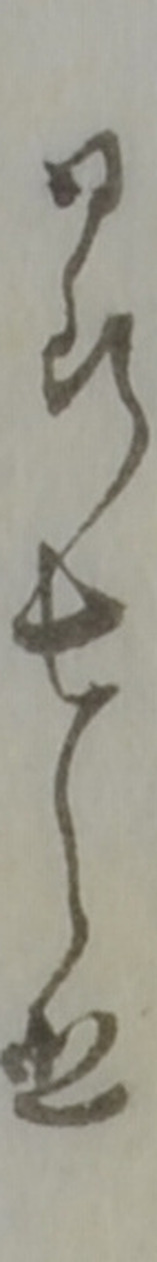同断七之丞
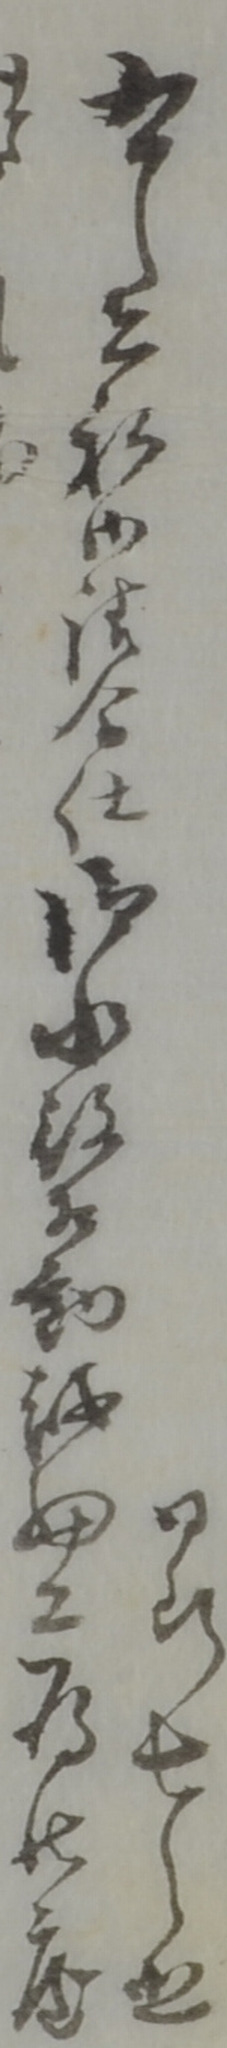右之書私御請合仕御水役相勤趣細工為仕度
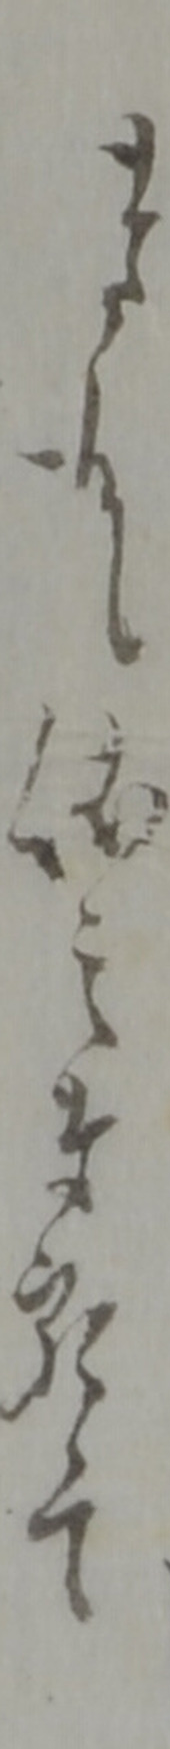奉存候依之奉願上候
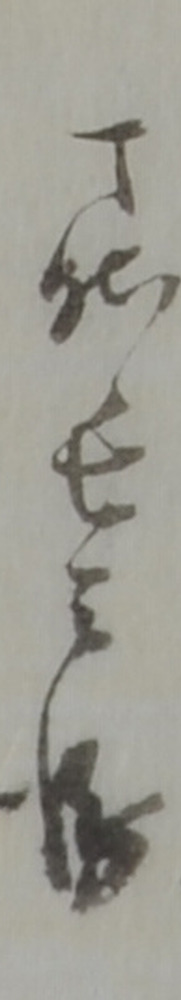丁代長兵衛
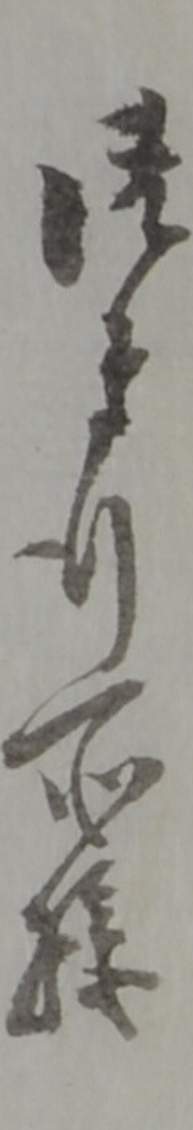御奉行所様
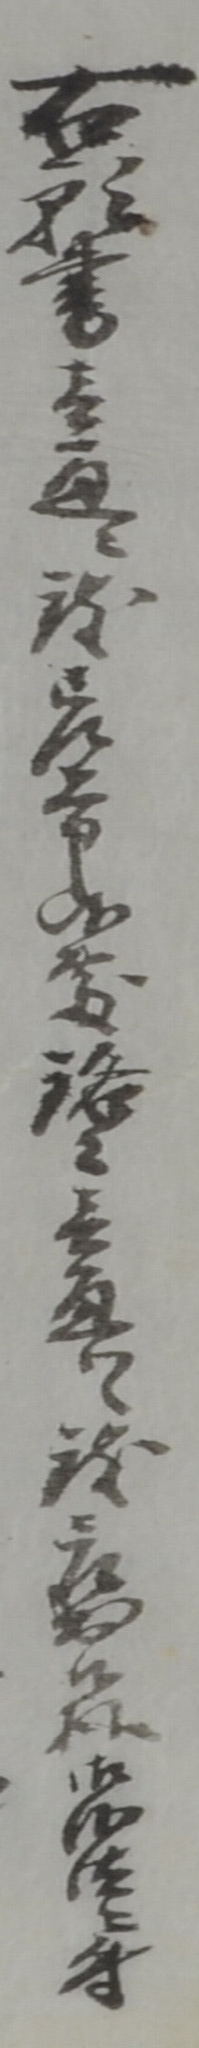右願書壱通ニ致差上申候処銘々壱通ツヽ致差出候様御沙汰ニ付
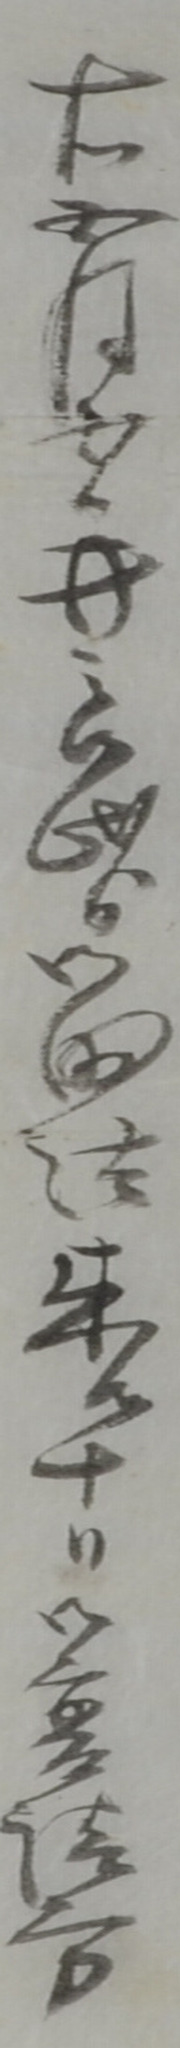右五月五日井良氏ゟ御沙汰来ル十日御普請方
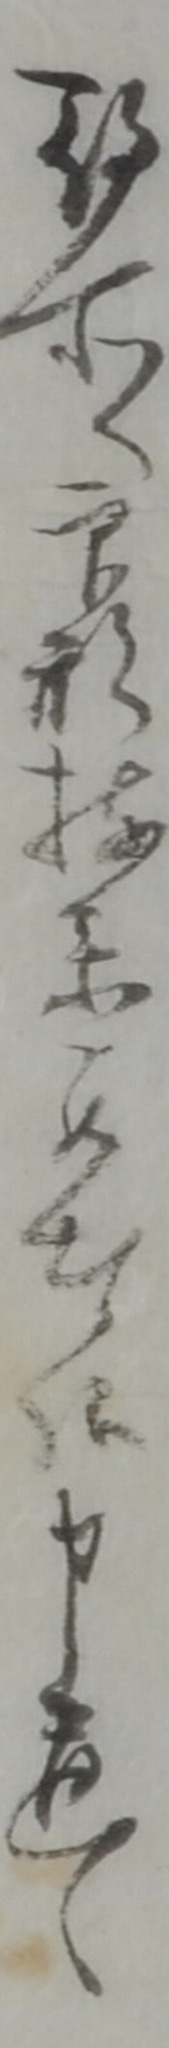役所へ印形持参罷出様申達候

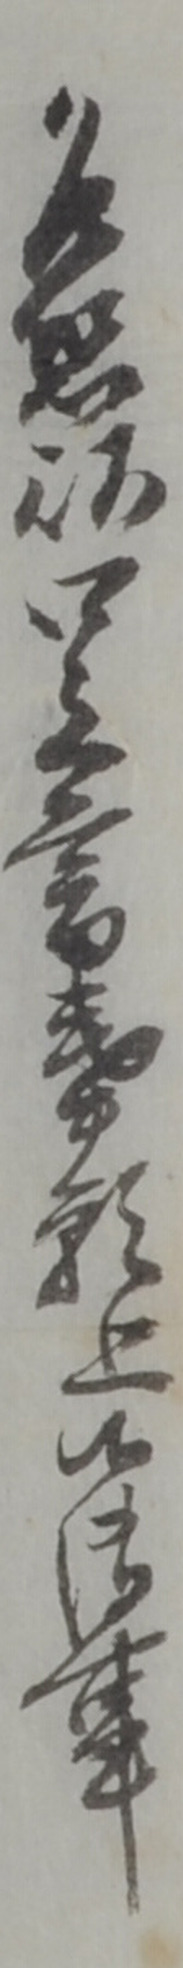乍恐以口上書奉願上候御事
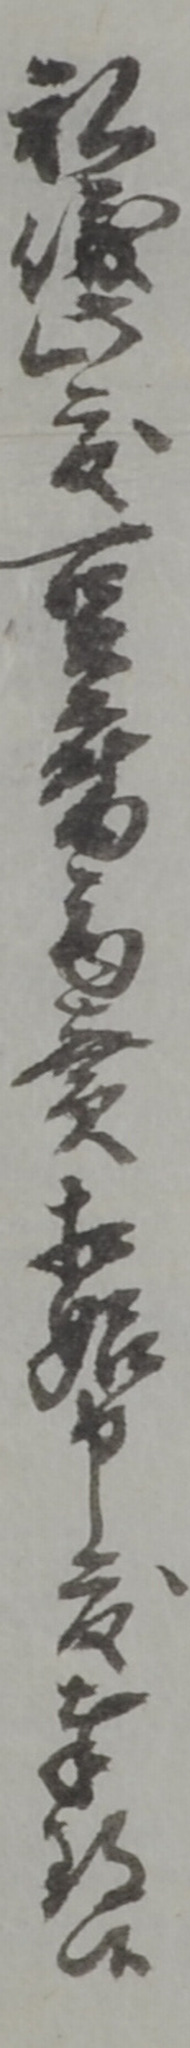私儀此度豆腐商売相始申度奉存候
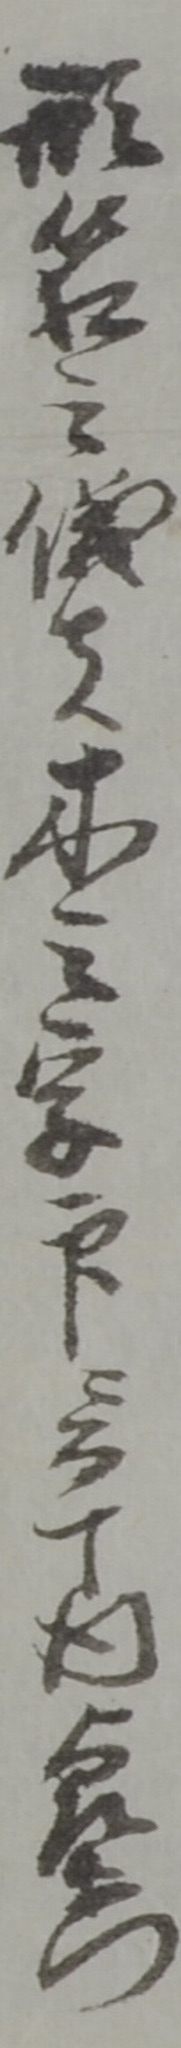形箱之儀者木之字印ニ而丁内与左衛門
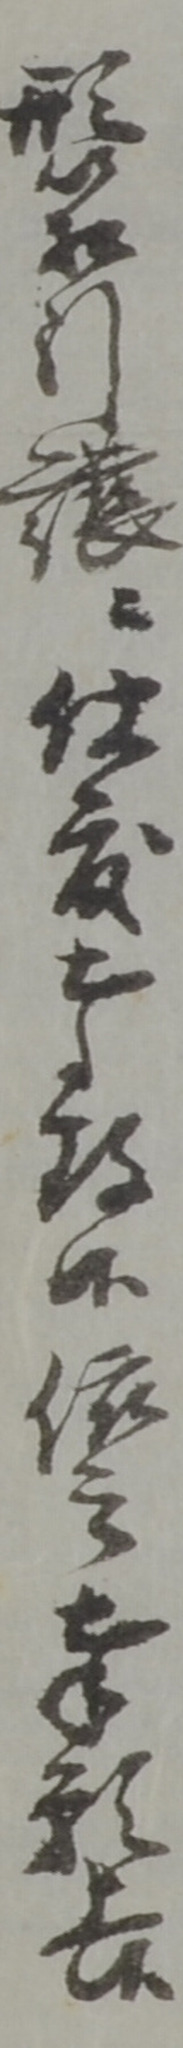形箱引譲ニ仕度奉存候依之奉願上候
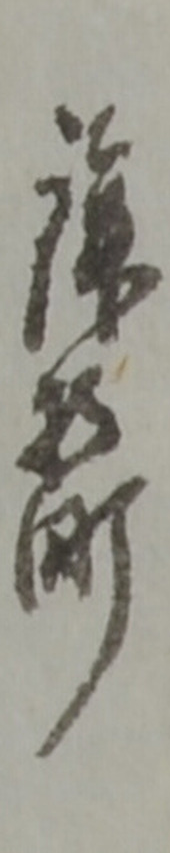鉾持町
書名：諸願書控簿
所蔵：伊那市立高遠町図書館・合同会社AMANE
